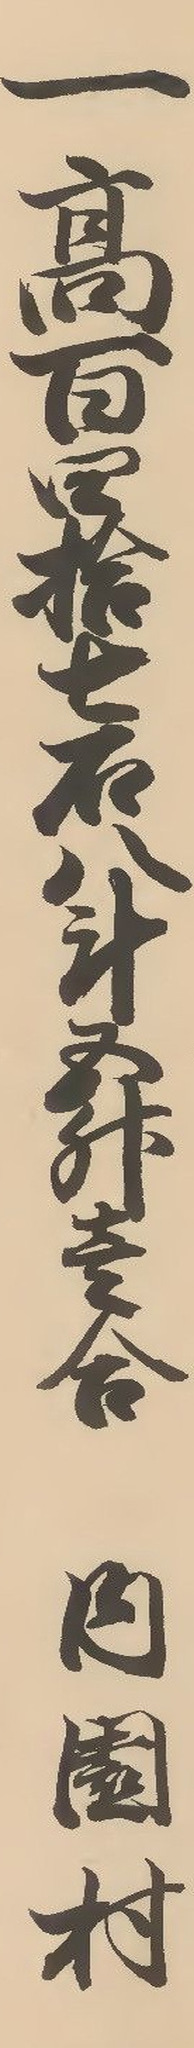一髙百四拾七石八斗五升壱合内園村
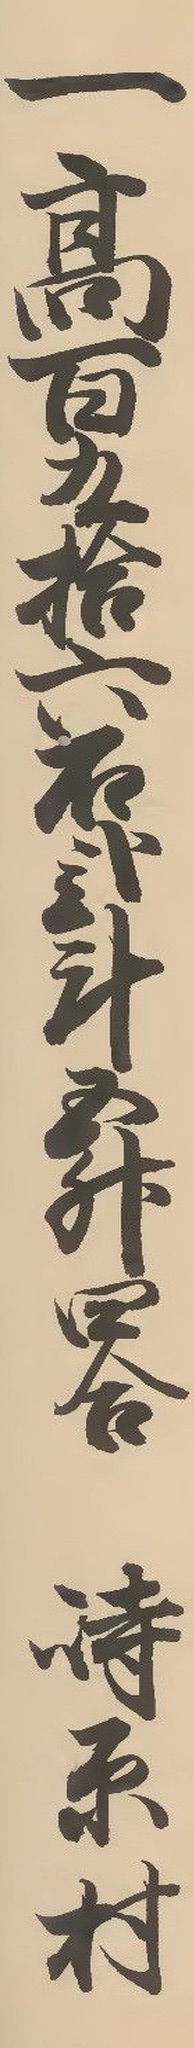一髙百九拾六石弐斗五升四合崎原村
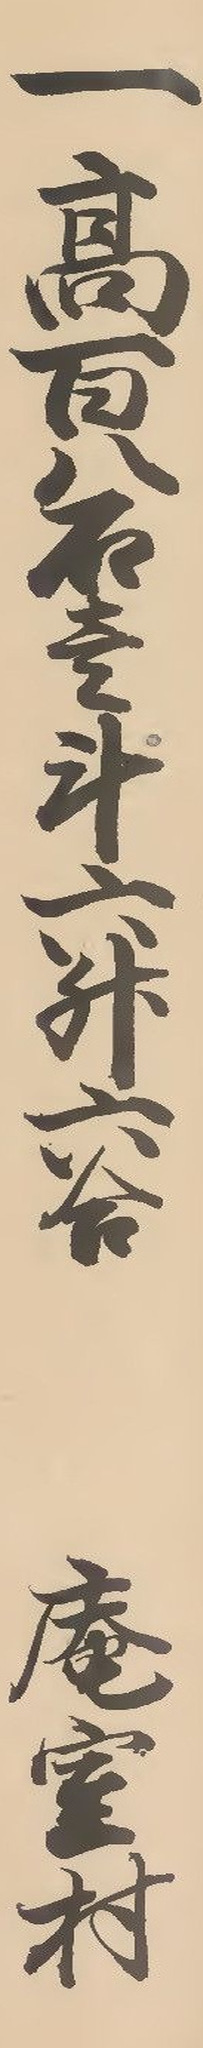一髙百八石壱斗六升六合庵室村
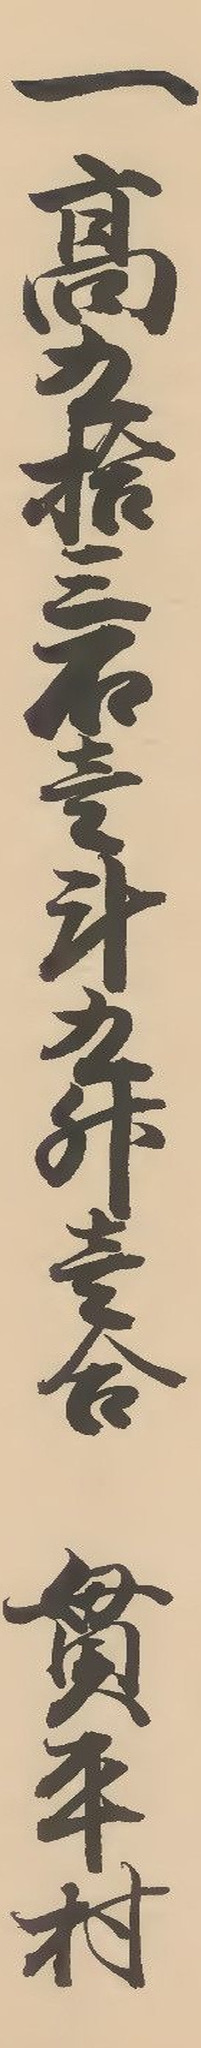一髙九拾三石壱斗九升壱合貫平村
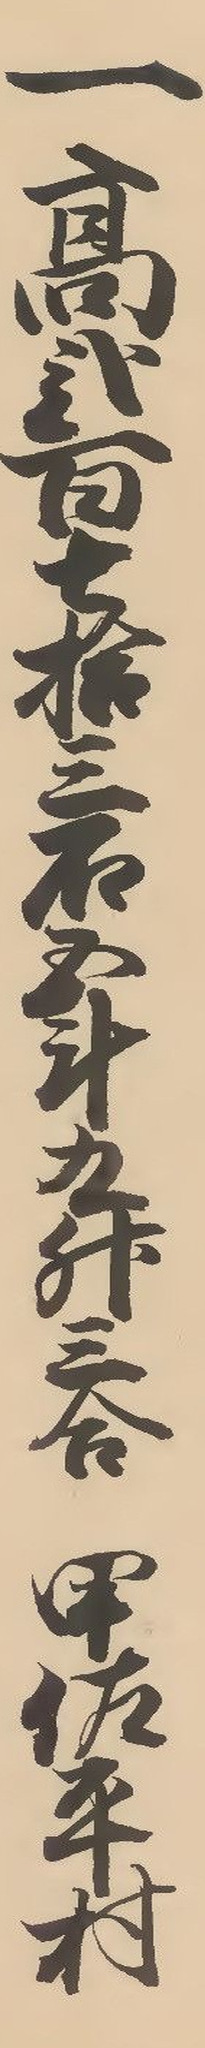一髙弐百七拾三石五斗九升三合甲佐平村
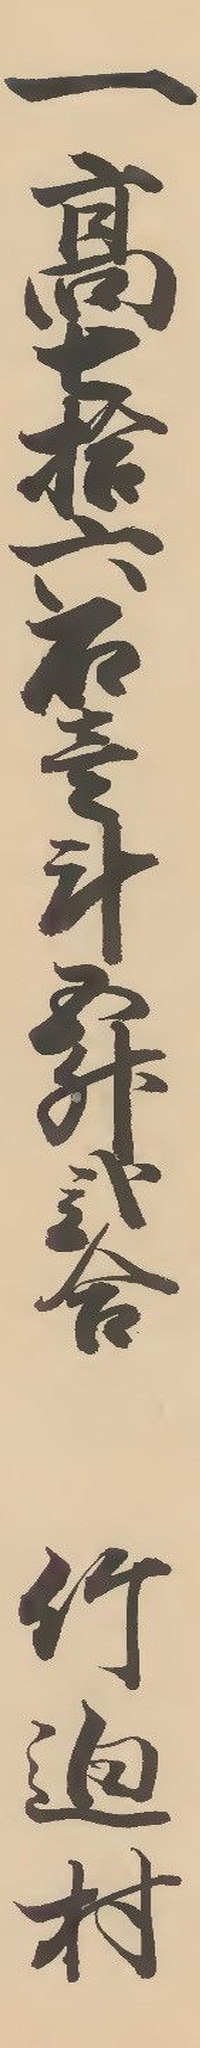一髙七拾六石壱斗五升弐合竹迫村

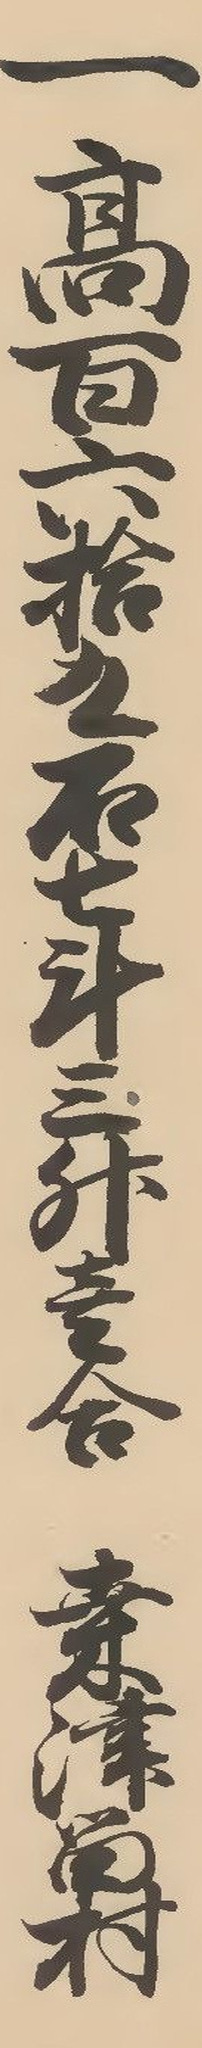一髙百六拾九石七斗三升壱合桑津留村
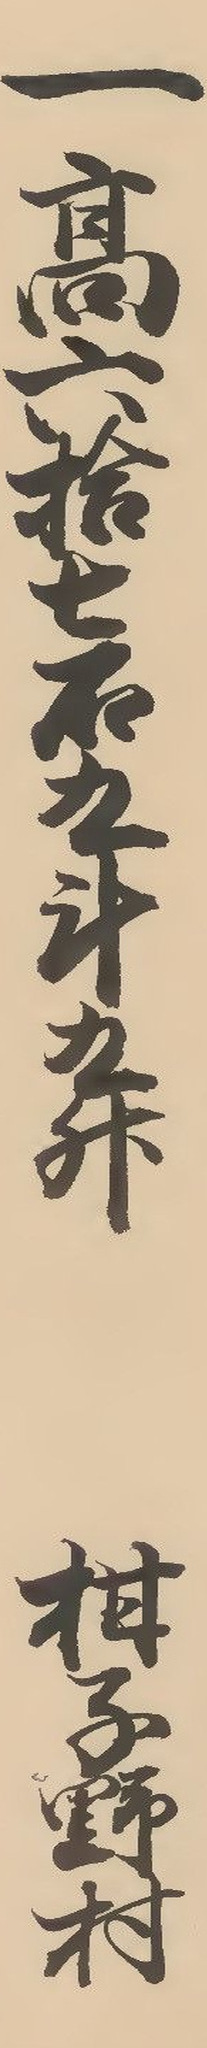一髙六拾七石九斗九升柑子野村
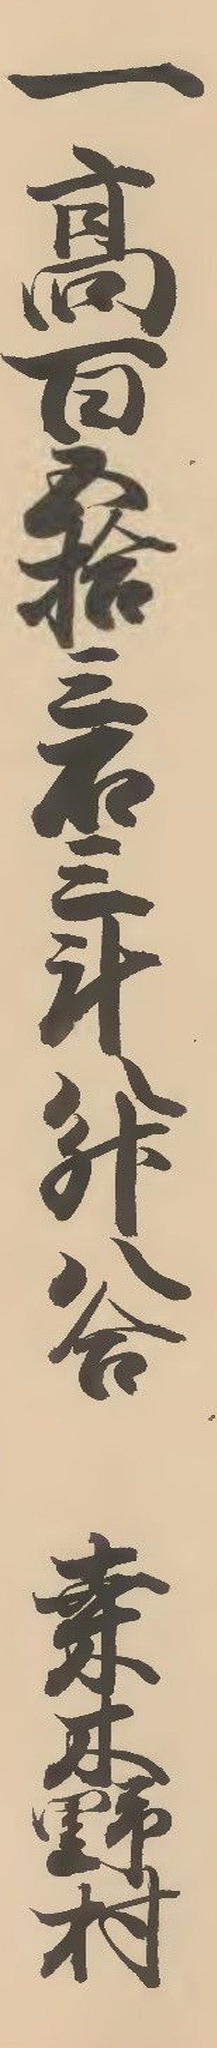一髙百五拾三石三斗八升八合桑木野村
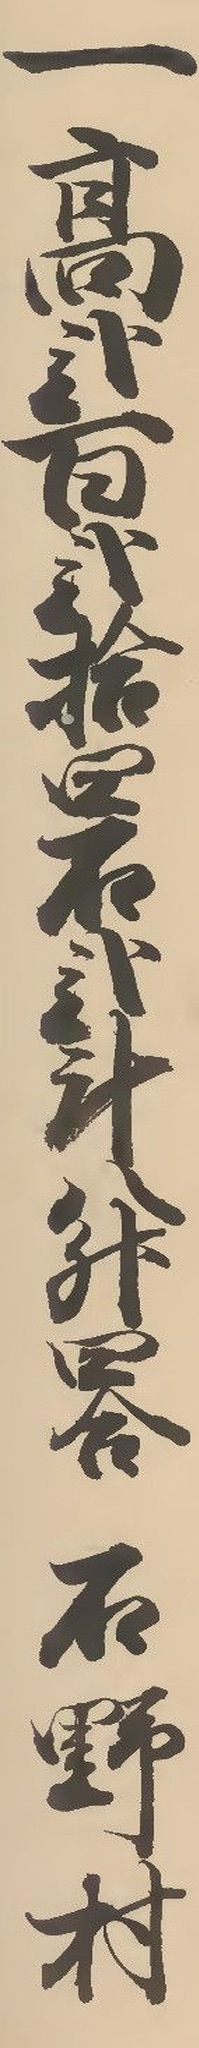一髙弐百弐拾四石弐斗八升四合石野村
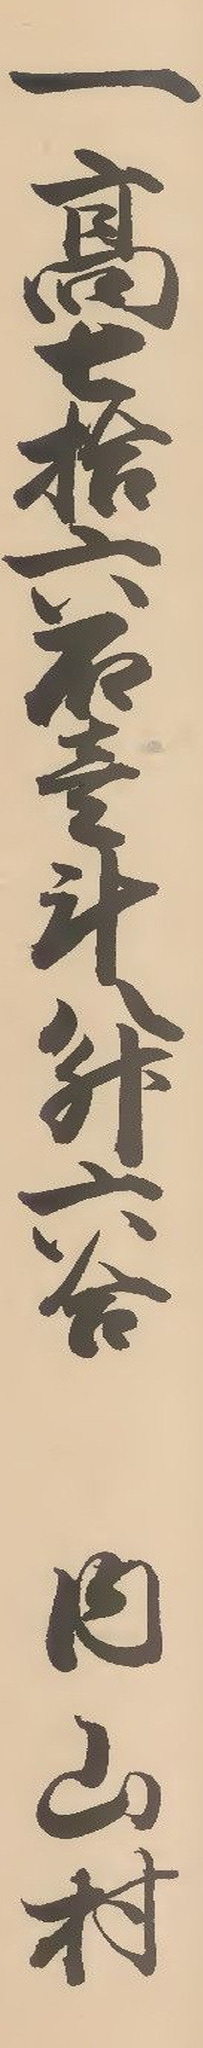一髙七拾六石壱斗八升六合内山村
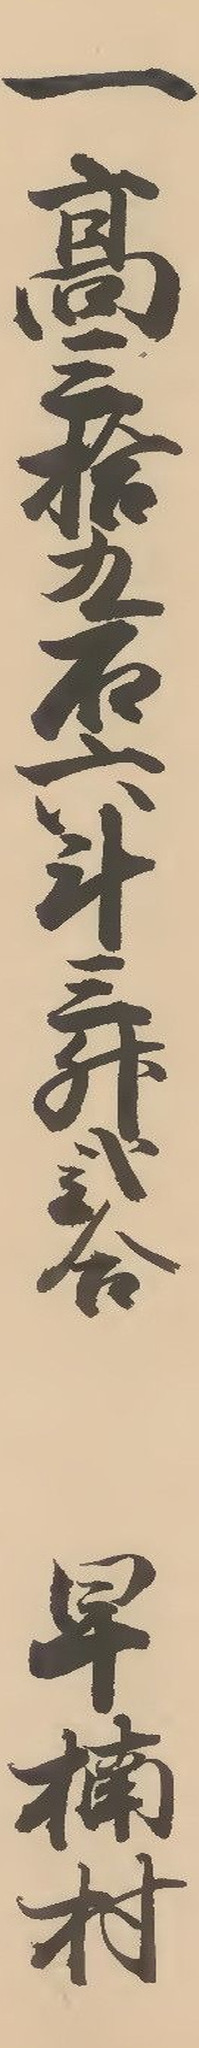一髙三拾九石六斗三升弐合早楠村
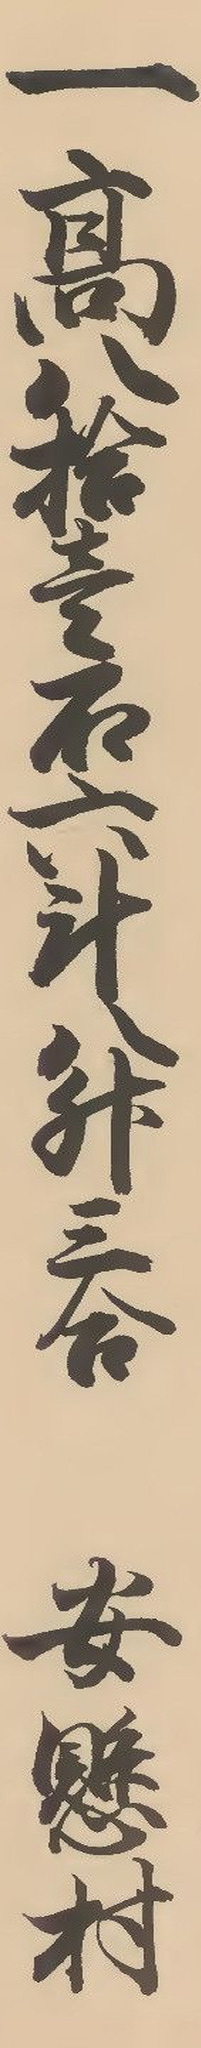一髙八拾壱石六斗八升三合安懸村
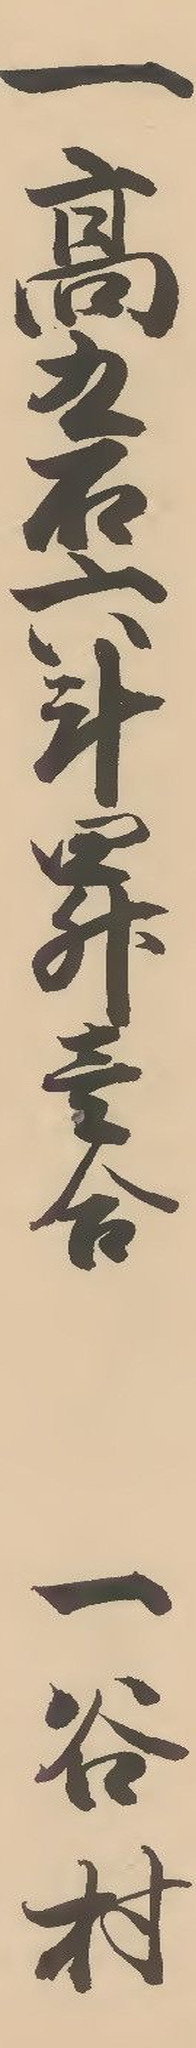一髙九石六斗四升壱合一谷村

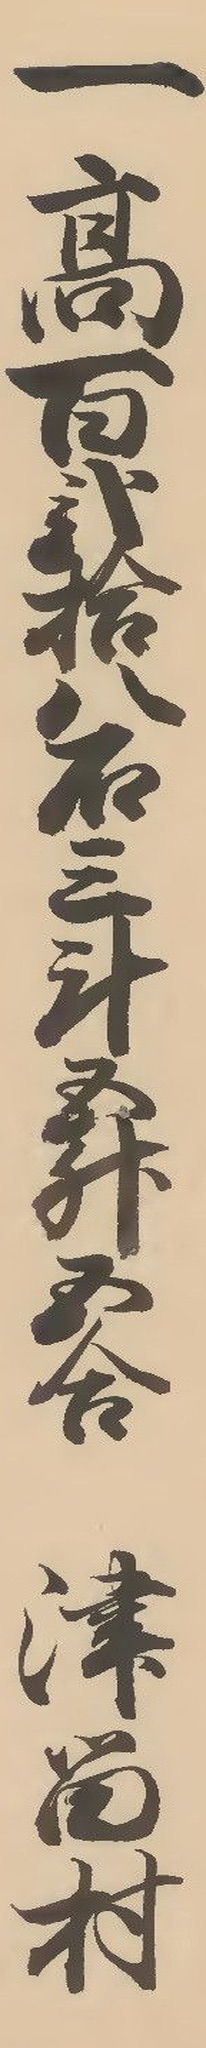一髙百弐拾八石三斗五升五合津留村
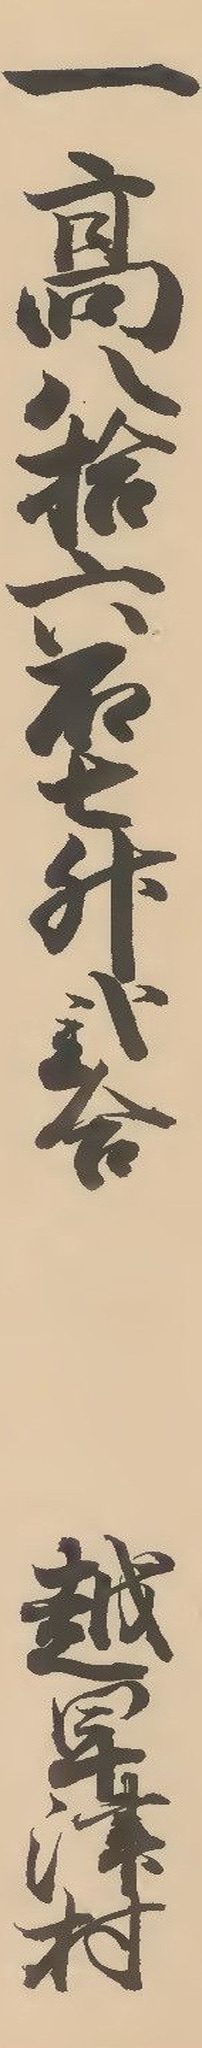一髙八拾六石七升弐合越早津村
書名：肥後国郷帳
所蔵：国立公文書館 National Archives of Japan
